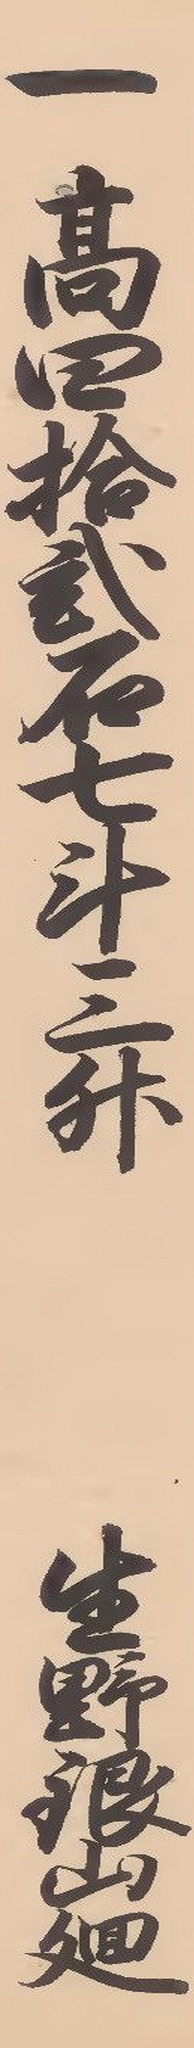一高四拾弐石七斗三升生野銀山廻
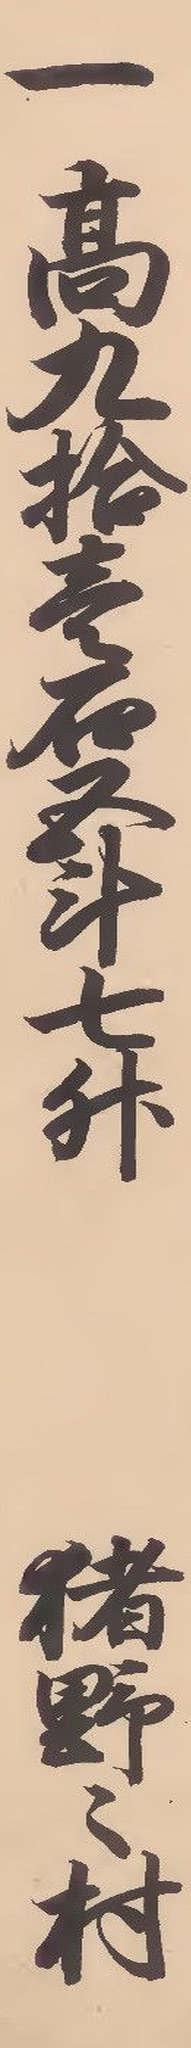一高九拾壱石五斗七升猪野々村

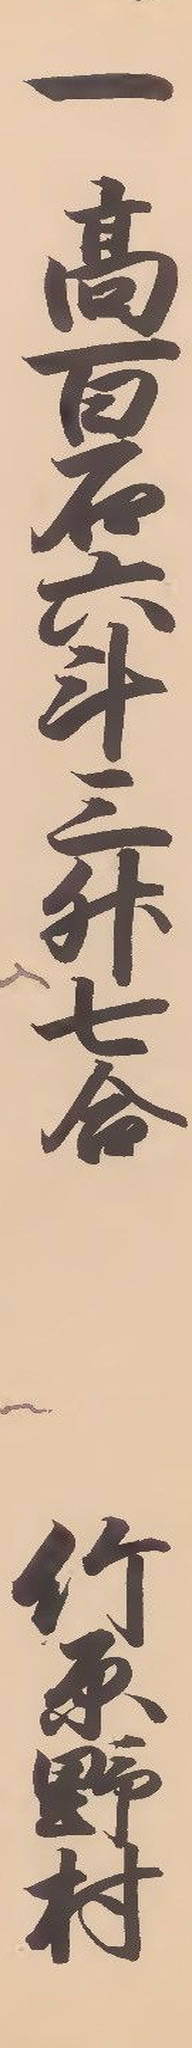一高百石六斗三升七合竹原野村
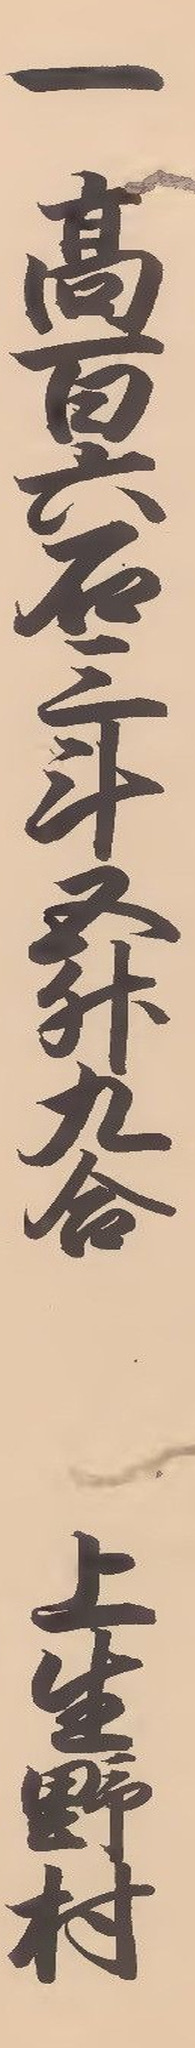一高百六石三斗五升九合上生野村
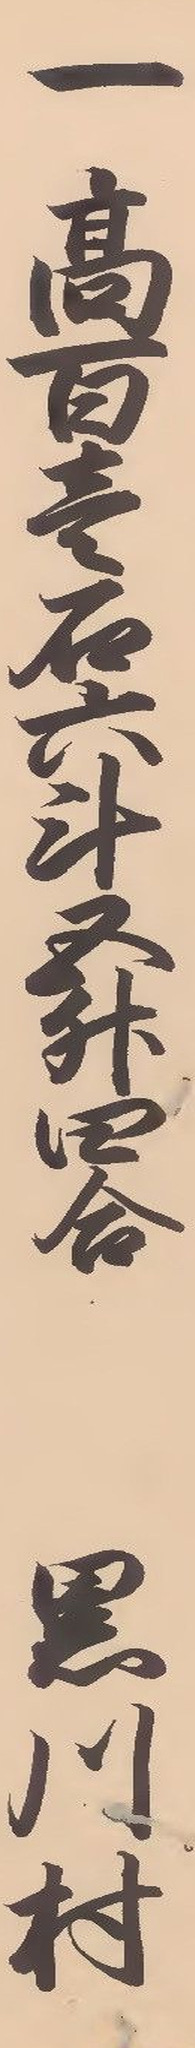一高百壱石六斗五升四合黒川村
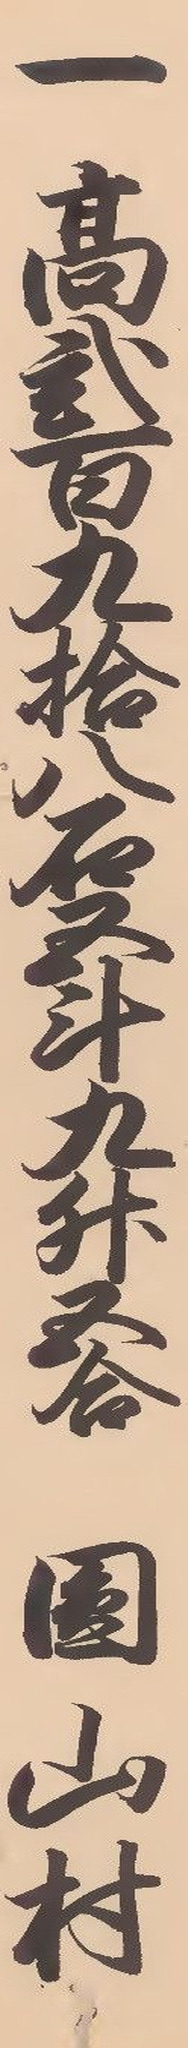一高弐百九拾八石五斗九升五合円山村
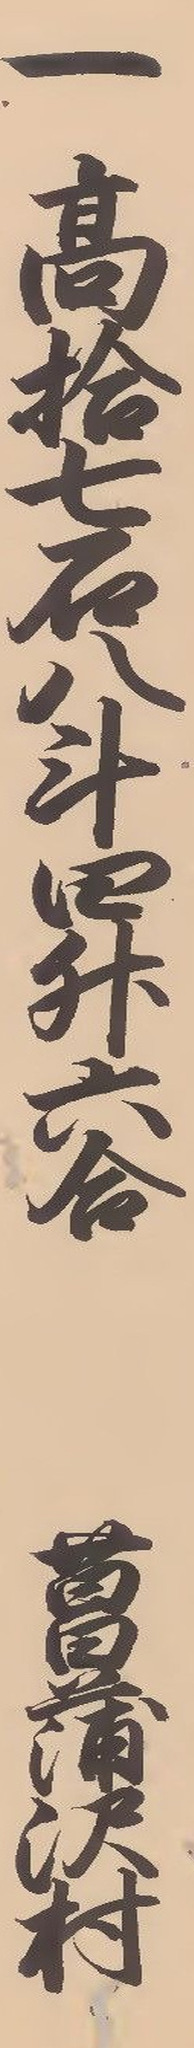一高拾七石八斗四升六合菖蒲沢村
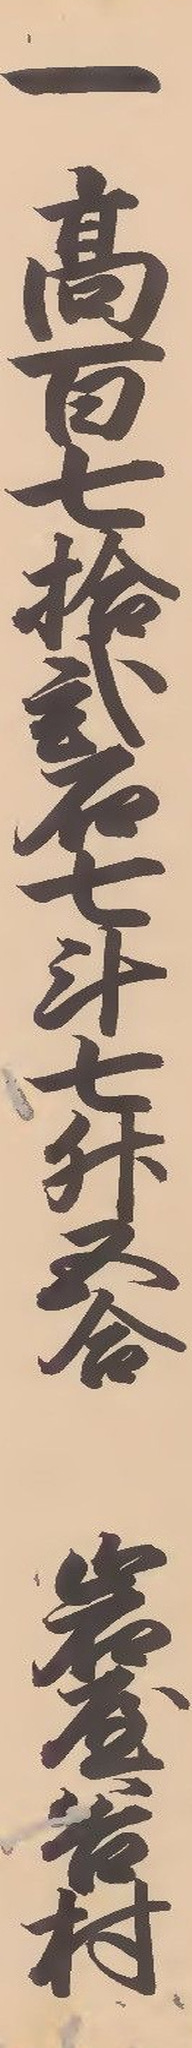一高壱百七拾弐石七斗七升五合岩屋谷村
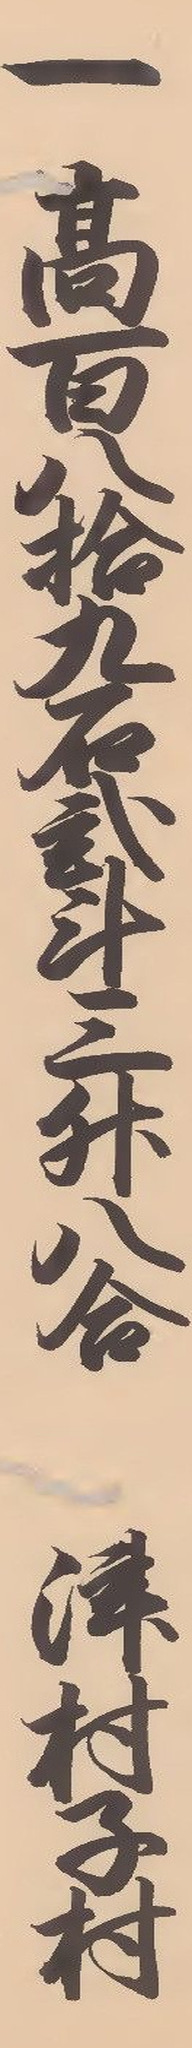一高壱百八拾九石弐斗三升八合津村子村
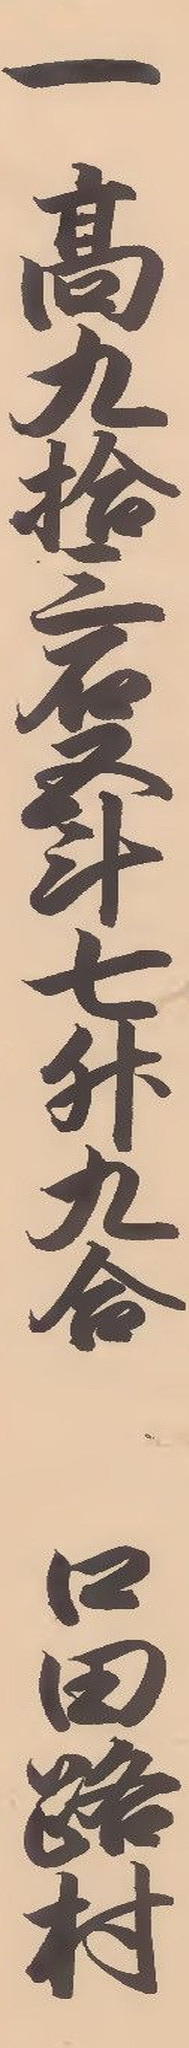一高九拾三石五斗七升九合口田路村

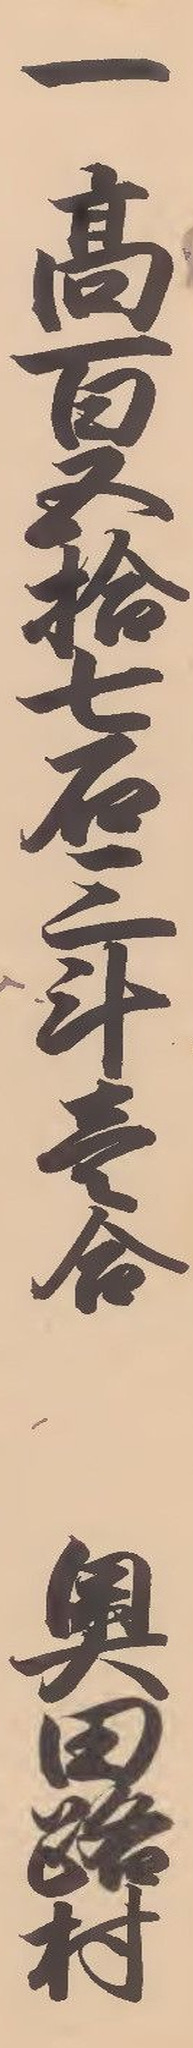一高百五拾七石三斗壱合奥田路村
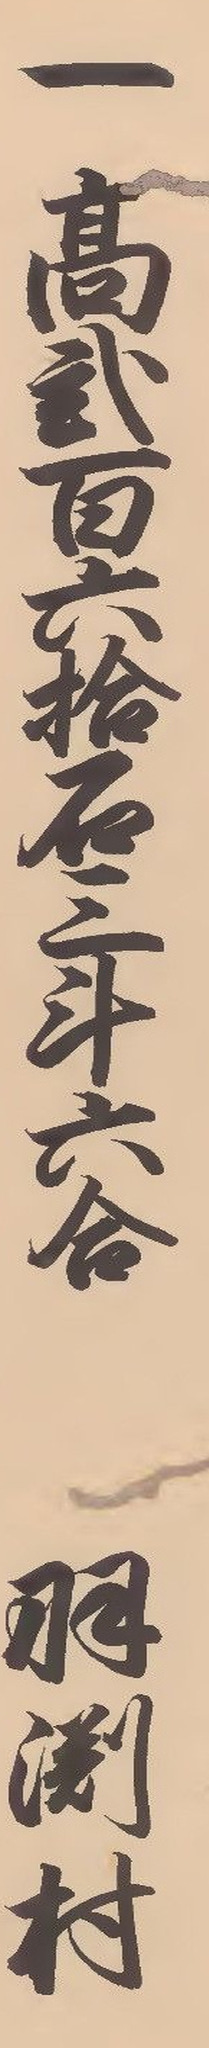一高弐百六拾石三斗六合羽渕村
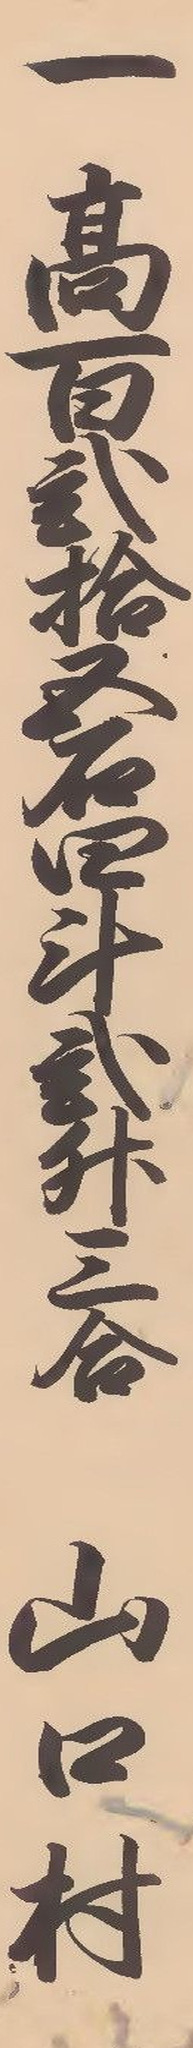一高百弐拾五石四斗弐升三合山口村
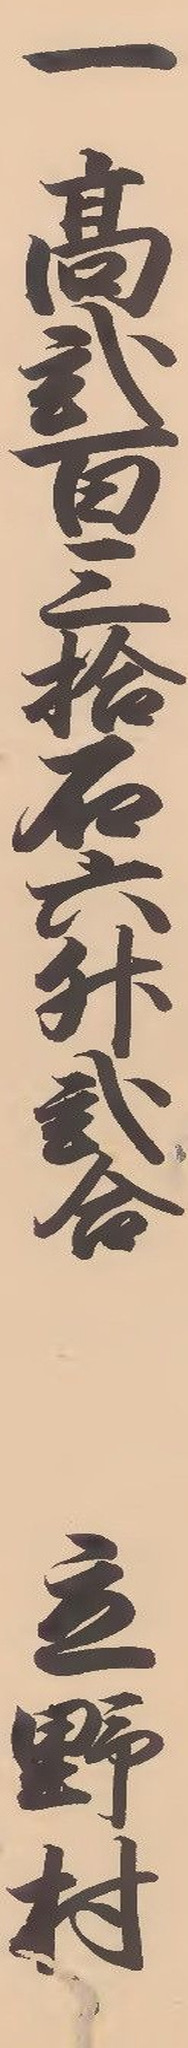一高弐百三拾石六升弐合立野村
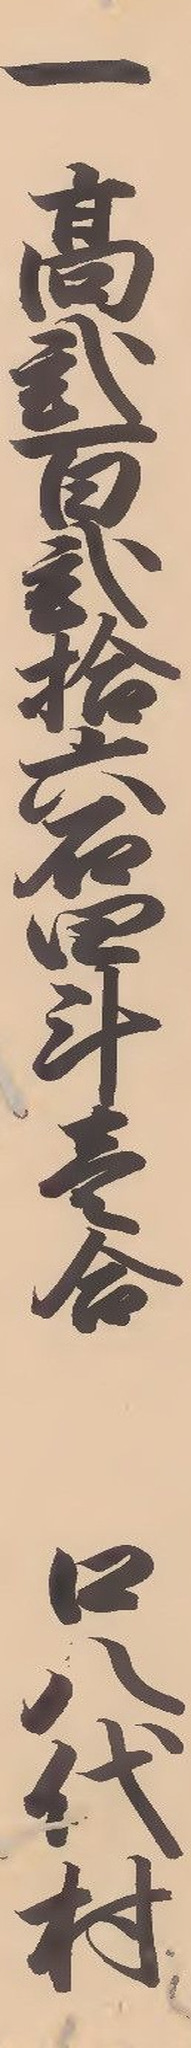一高弐百弐拾六石四斗壱合口八代村
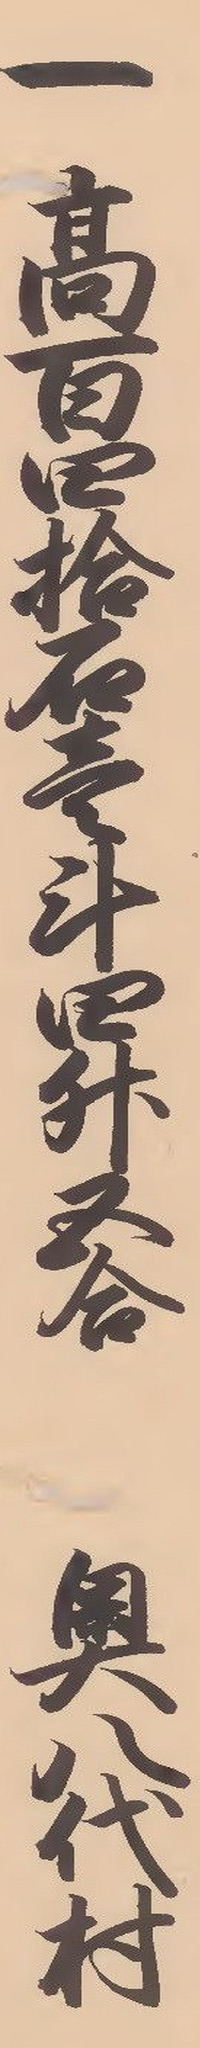一高百四拾石壱斗四升五合奥八代村
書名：但馬国郷帳
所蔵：国立公文書館 National Archives of Japan
